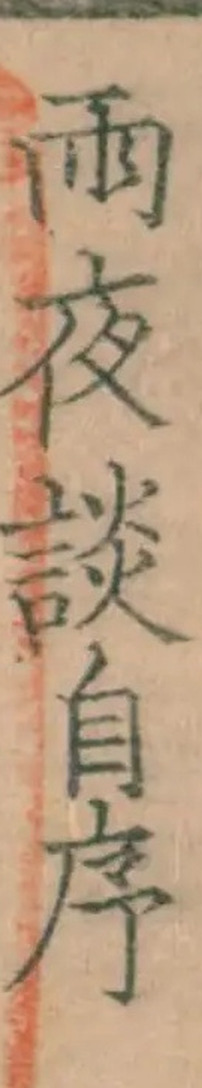雨夜談自序
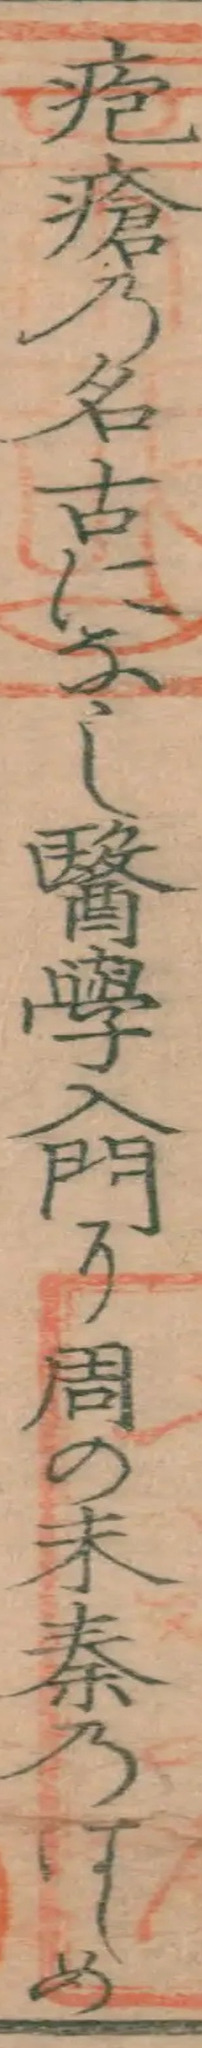疱瘡の名古になし医学入門に周の末秦のはしめ
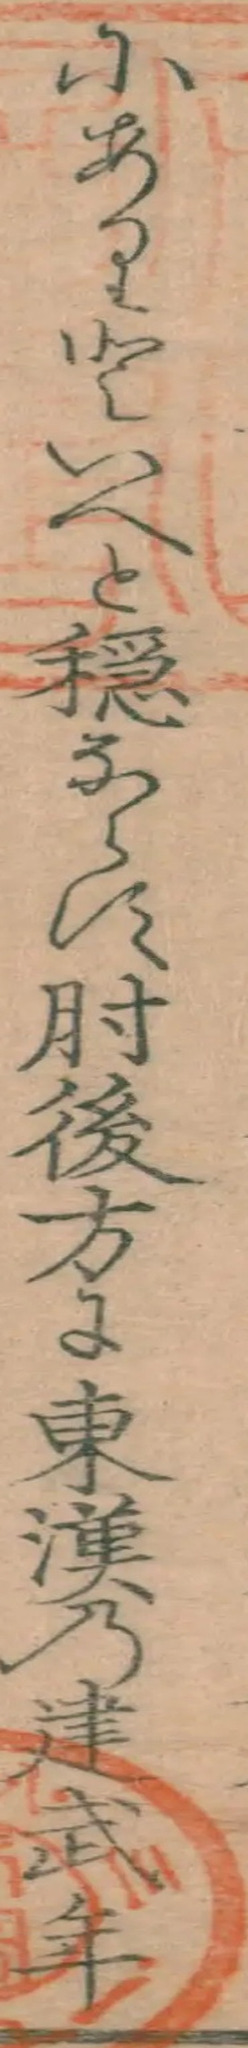にありといへと穏ならす肘後方に東漢の建武年
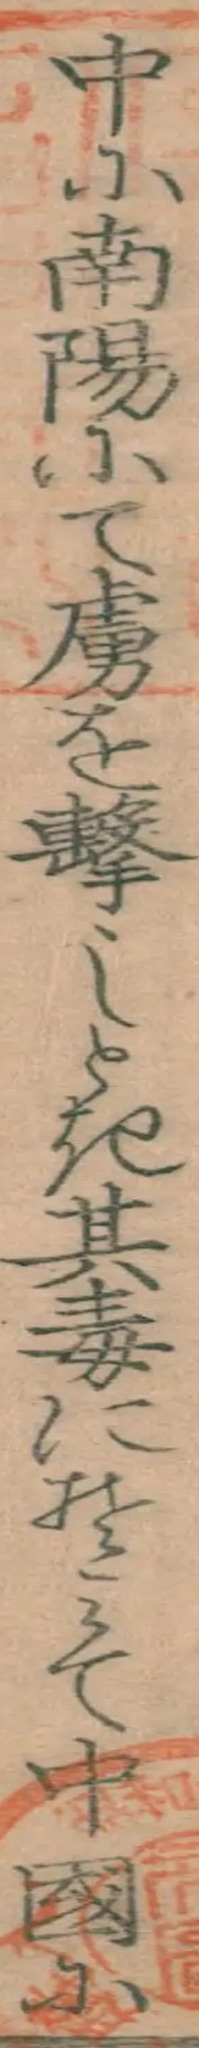中に南陽にて虜を撃しとき其毒にそみて中国に
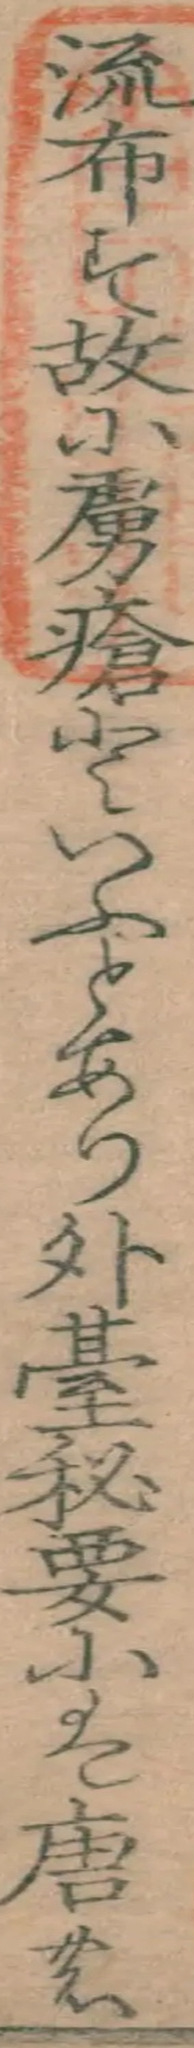流布す故に虜瘡といふとあり外台秘要には唐の
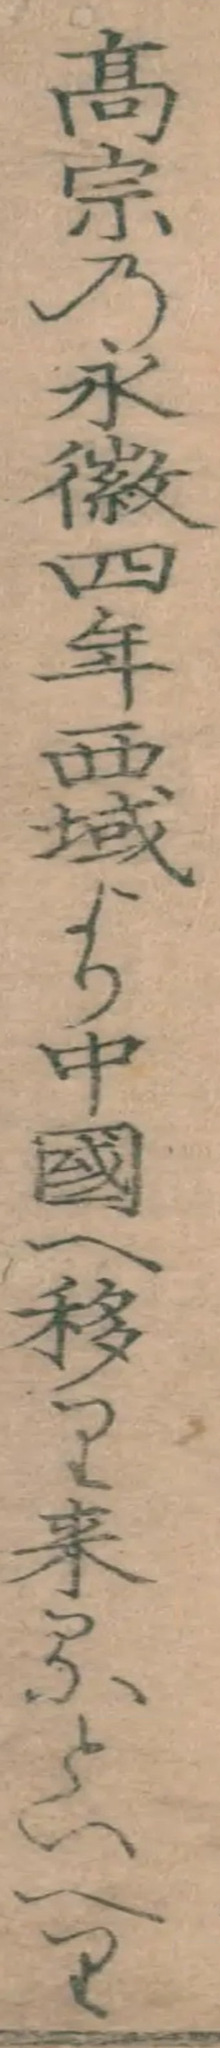高宗の永徽四年西域より中国へ移り来るといへり

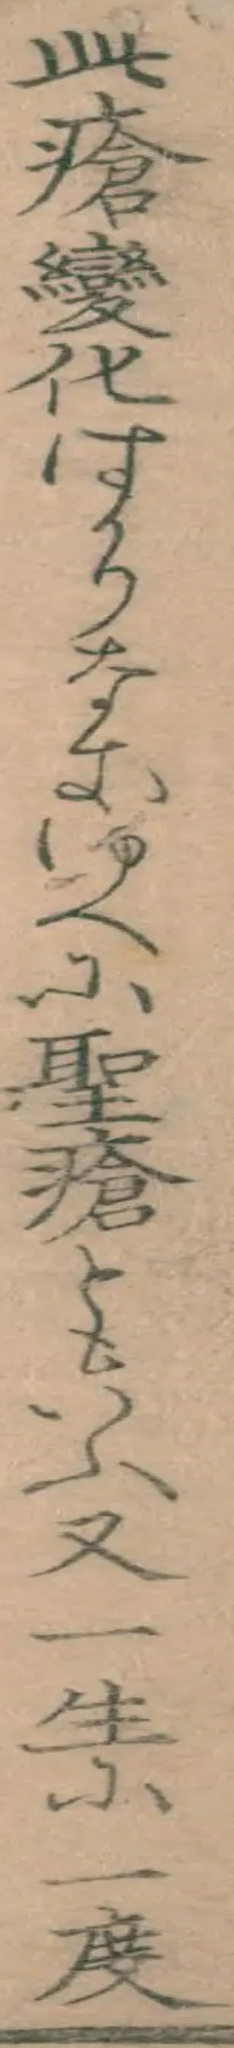此瘡変化はかりなきゆへに聖瘡ともいふ又一生に一度
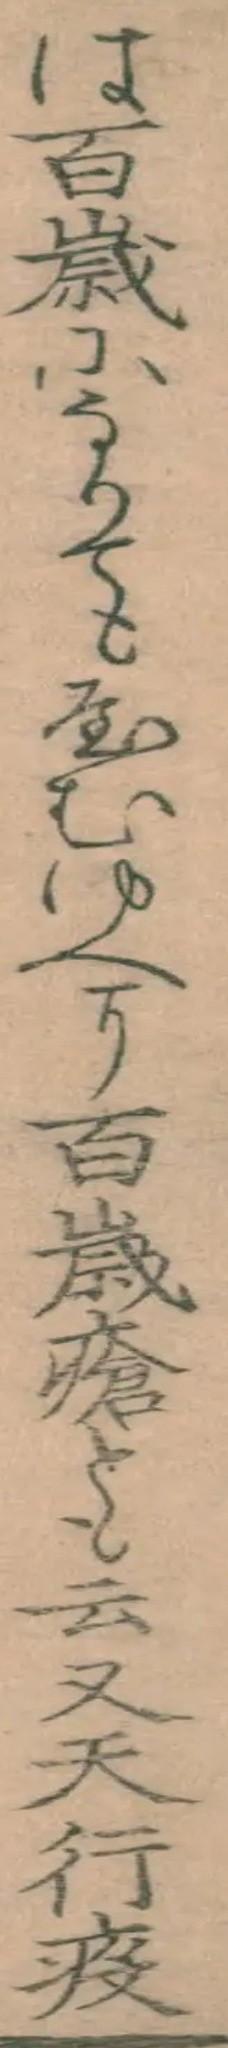は百歳になりてもやむゆへに百歳瘡とも云又天行疫
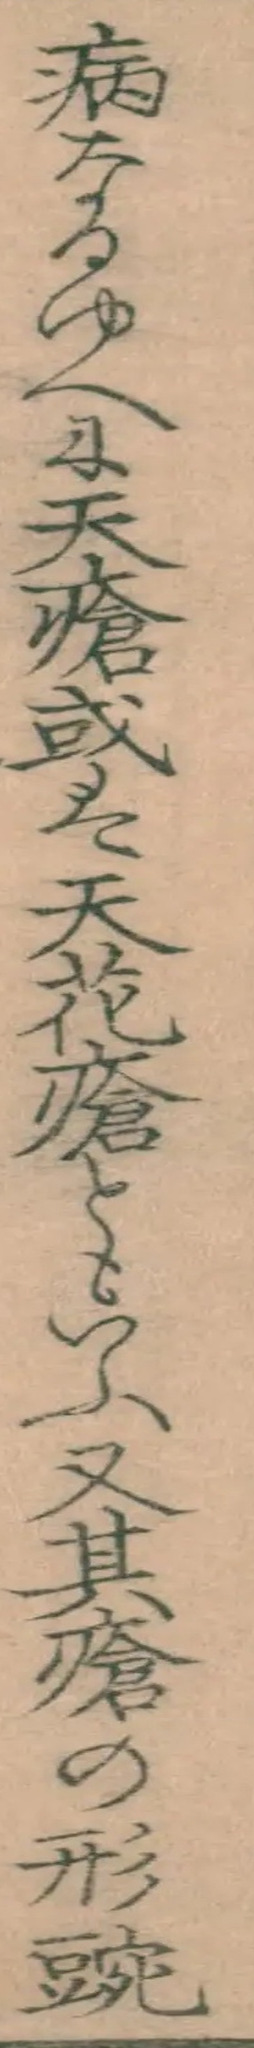病なるゆへに天瘡或は天花瘡ともいふ又其瘡の形豌
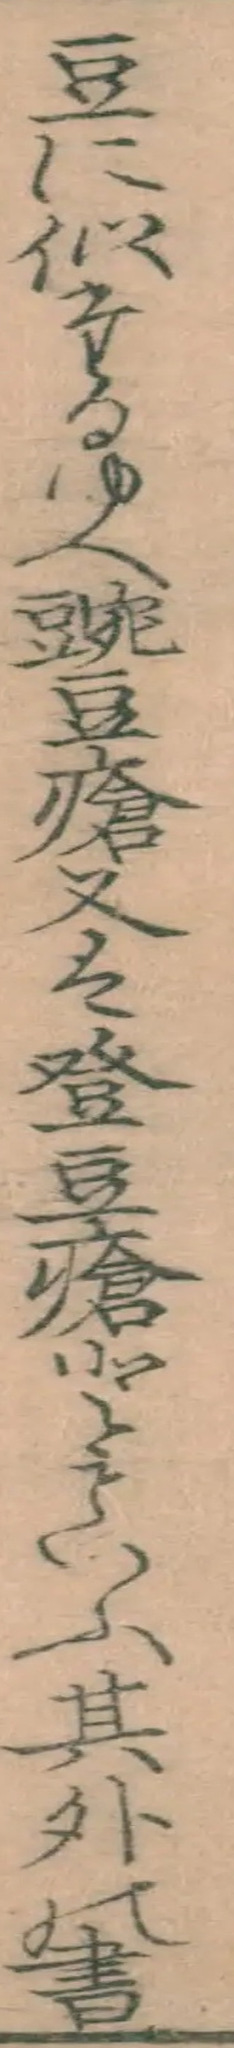豆に似たるゆへ豌豆瘡又は登豆瘡ともいふ其外の書
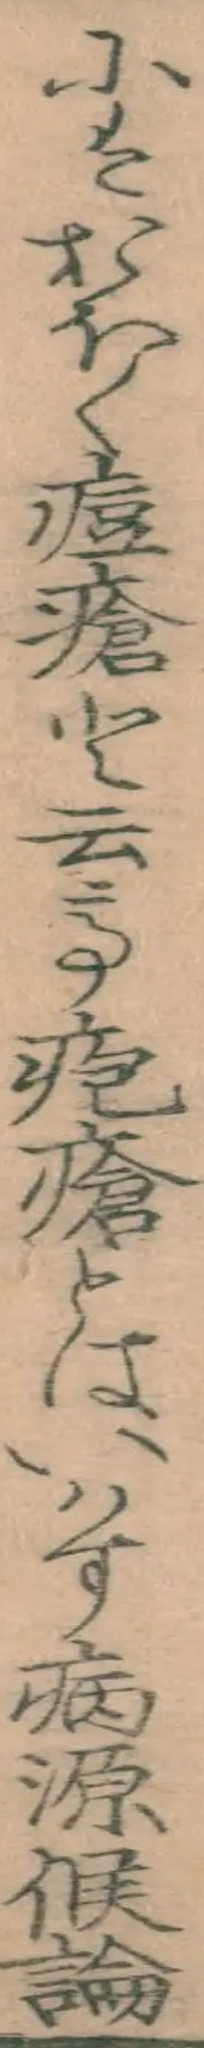にはおほく痘瘡と云て疱瘡とはいはす病源候論
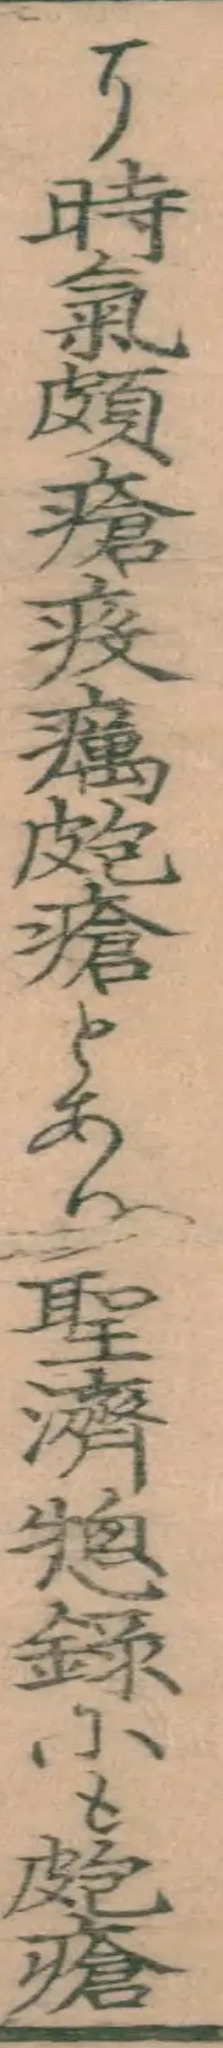に時気頗瘡疫癘皰瘡とあり聖済惣録にも皰瘡
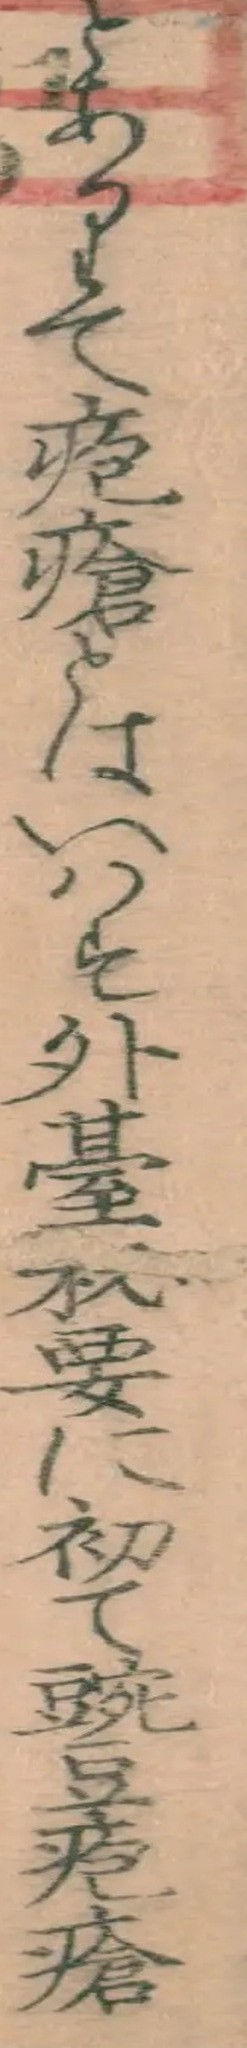とありて疱瘡とはいはす外台秘要に初て豌豆疱瘡
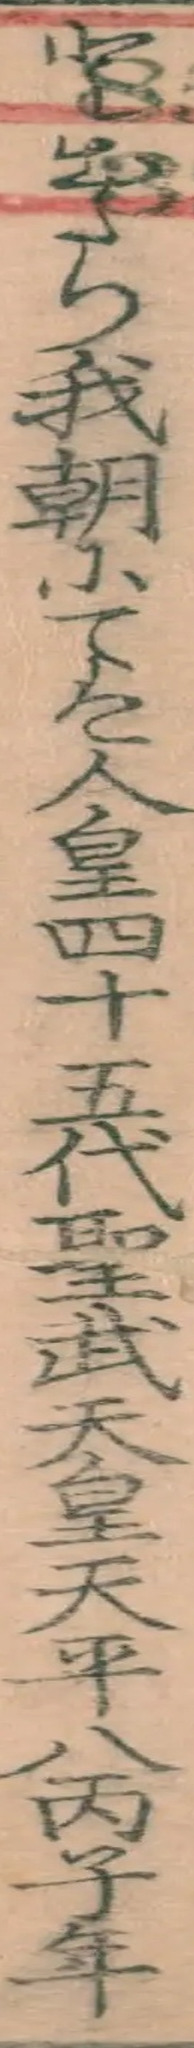と出たり我朝にては人皇四十五代聖武天皇天平八丙子年
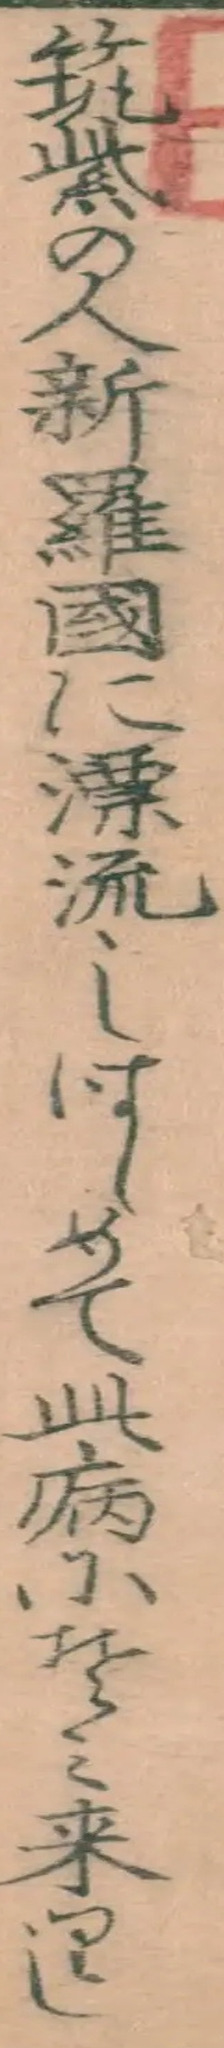筑紫の人新羅国に漂流しはしめて此病にそみ来りし
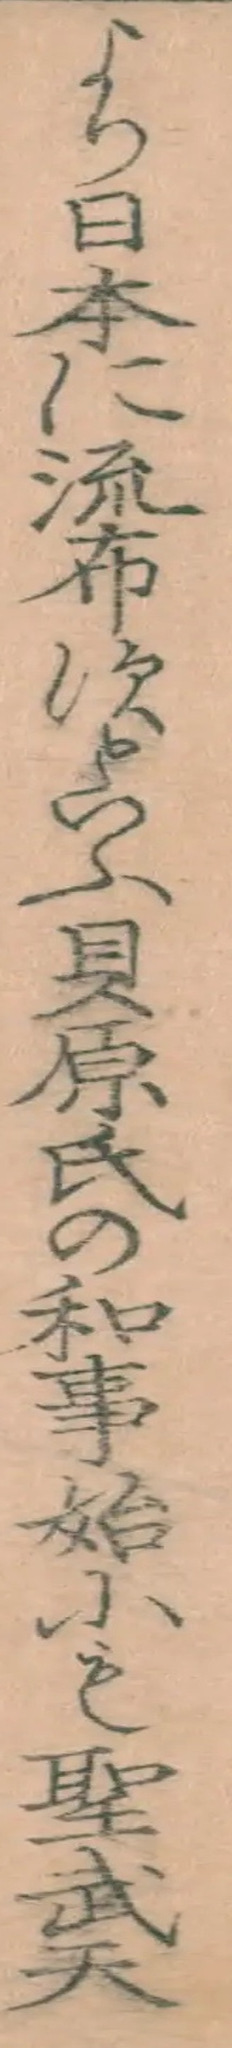より日本に流布すといふ貝原氏の和事始にも聖武天
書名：雨夜談
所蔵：国立国会図書館 National Diet Library, JAPAN
